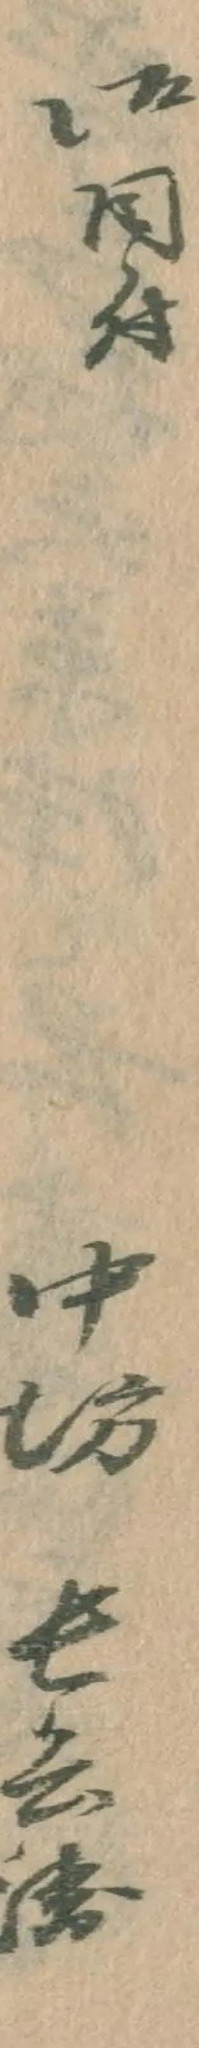御目付中坊長兵衛
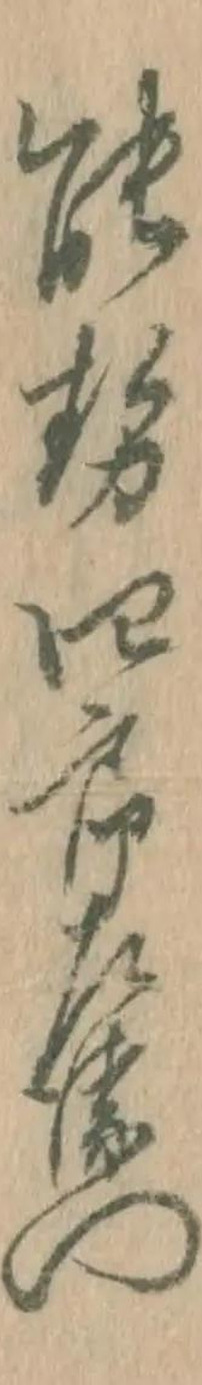能勢四郎左衛門

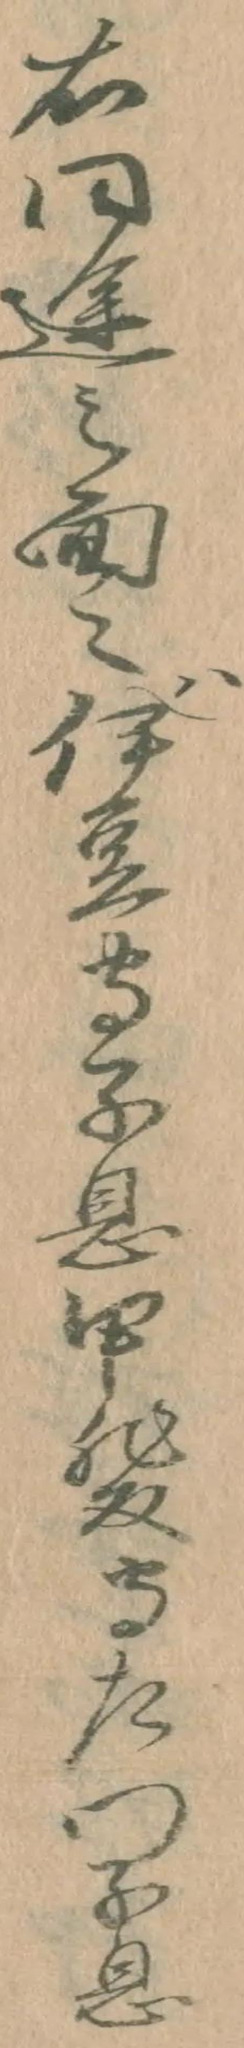右同途之面々は伊豆守子息甲斐守左門子息
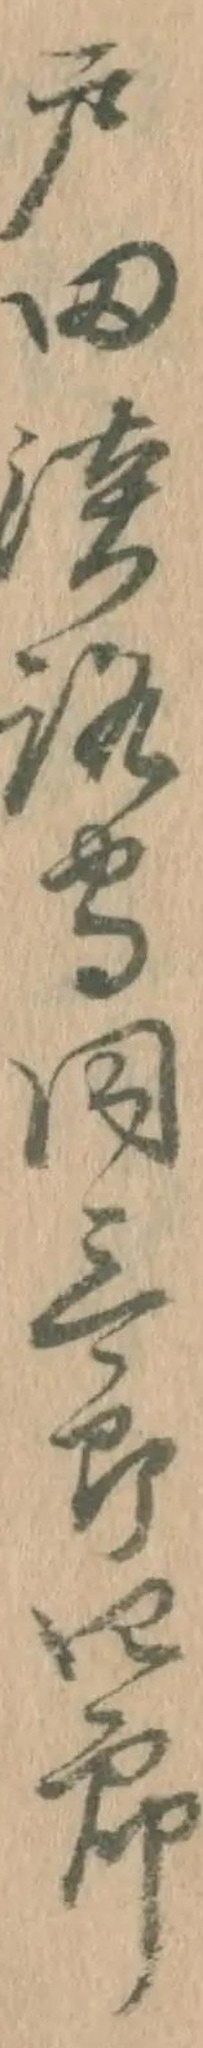戸田淡路守同三郎四郎
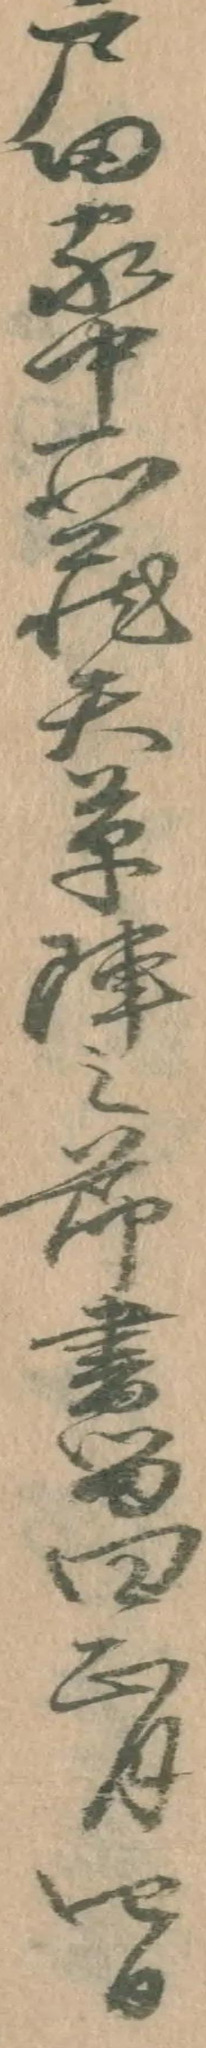戸田家中所蔵天草陣之節書留曰正月四日
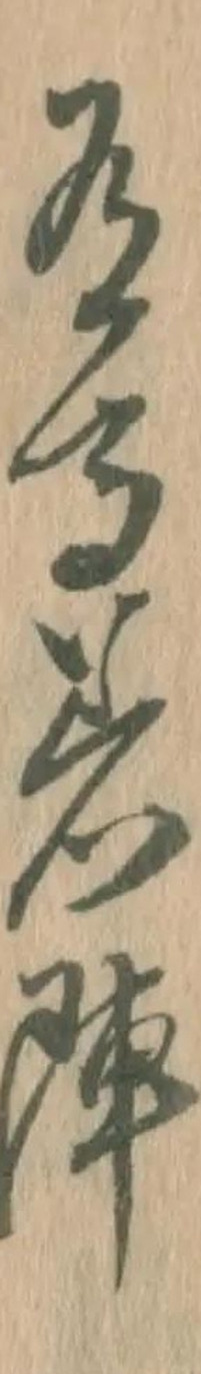有馬着陣
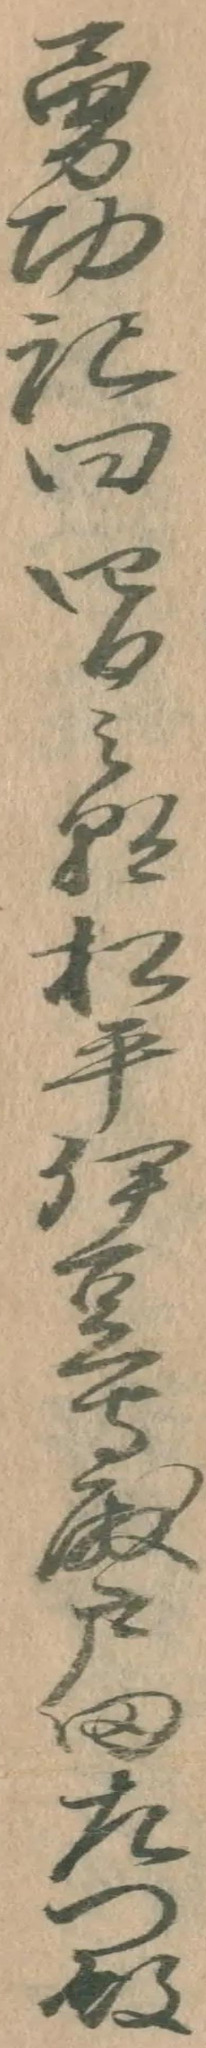勇功記曰四日之朝松平伊豆守殿戸田左門殿
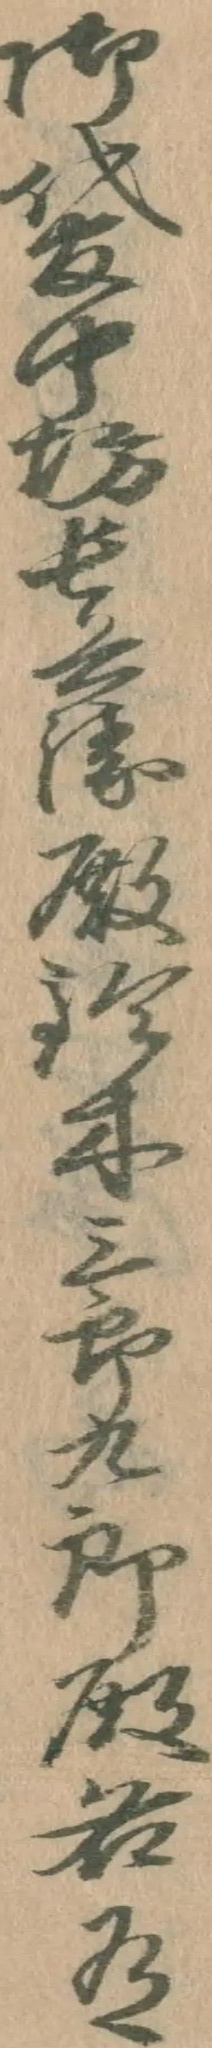御代官中坊長兵衛殿鈴木三郎九郎殿各有
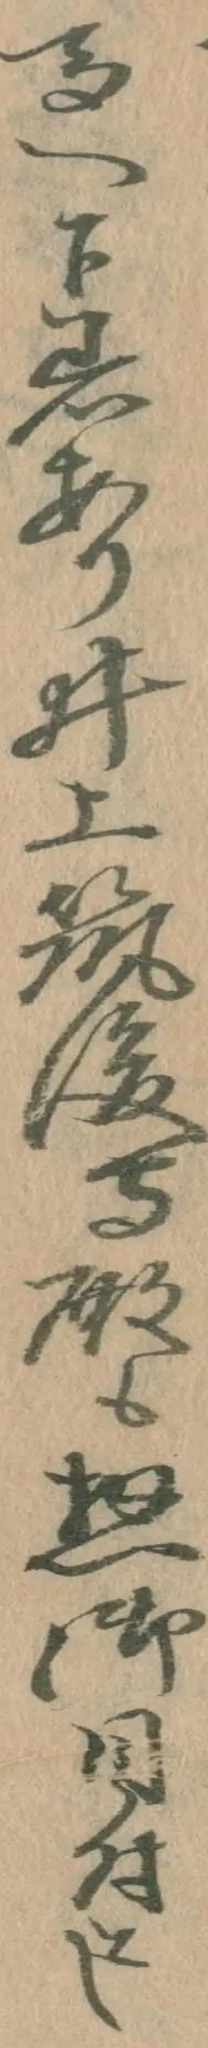馬へ下着あり井上筑後守殿も惣御目付とし
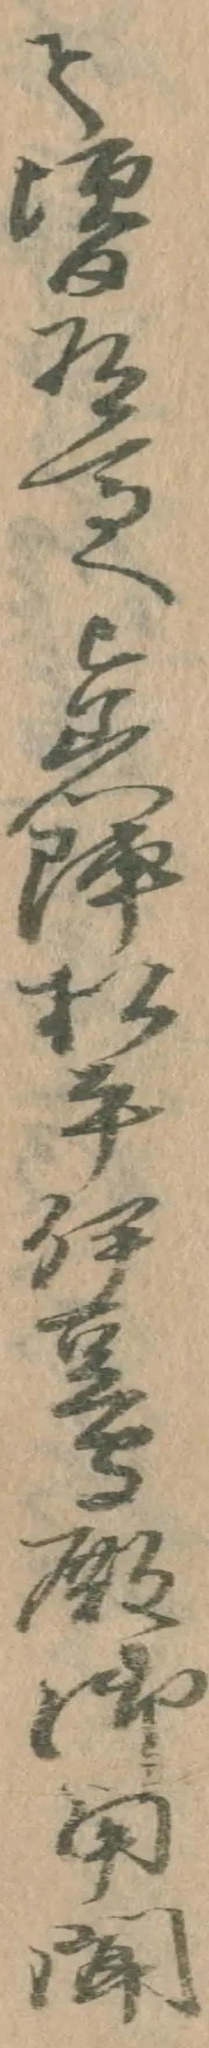て頃日有馬へ被着陣松平伊豆守殿御用聞
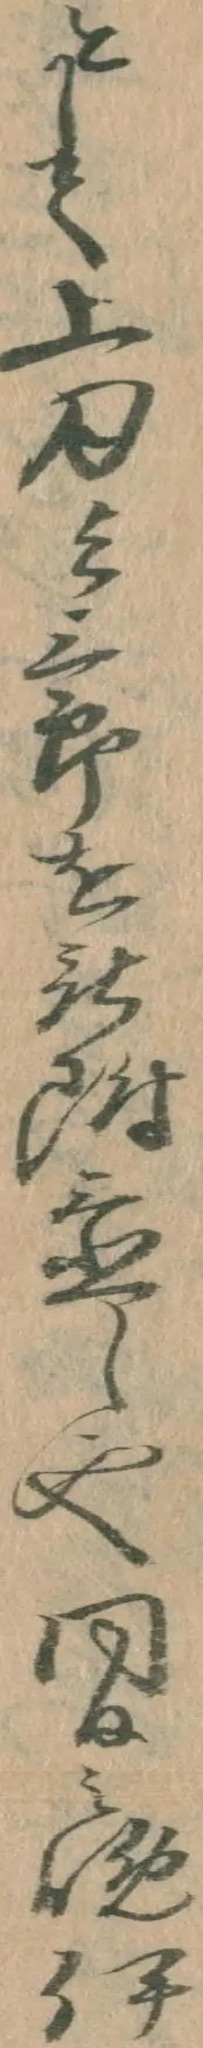として上月与三郎を被附置し也同日之晩伊
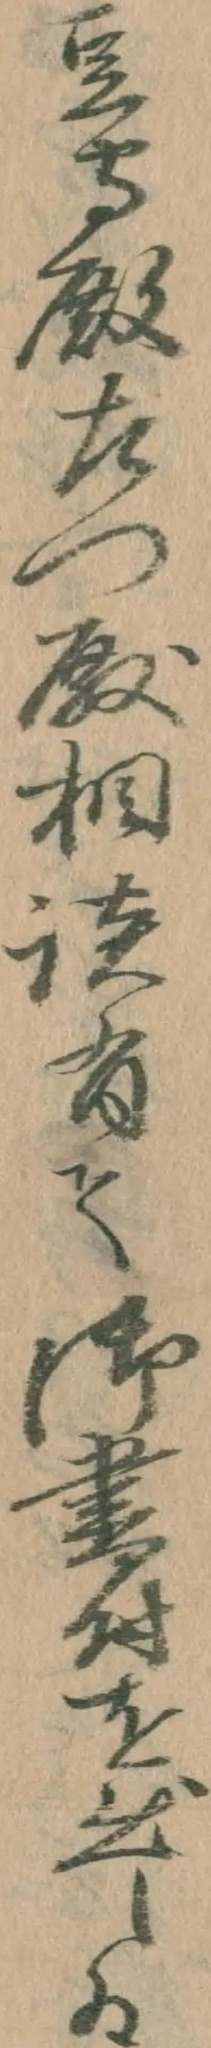豆守殿左門殿相談有て御書付を出しゐ
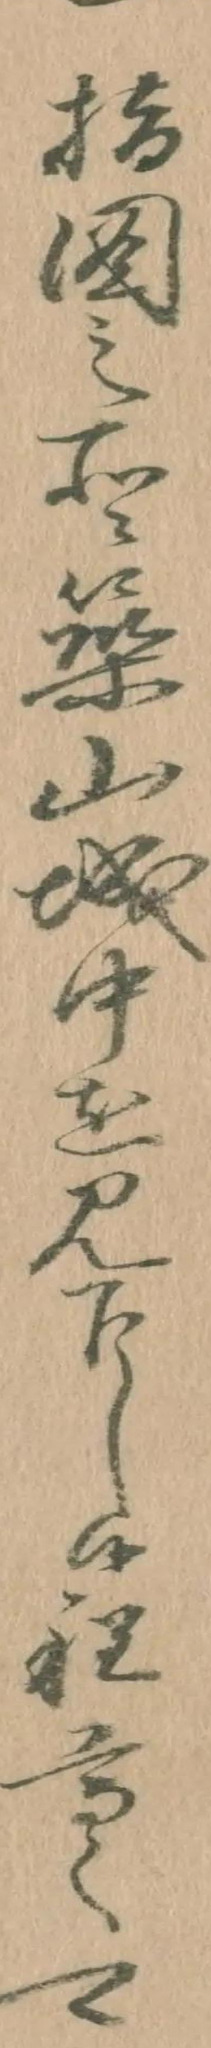一指図之所に築山城中を見下し候程高く可
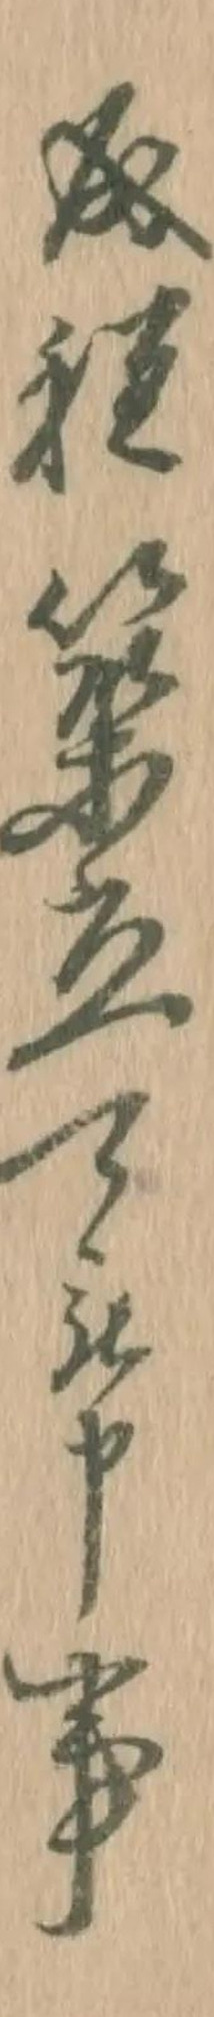成程築立可被申事
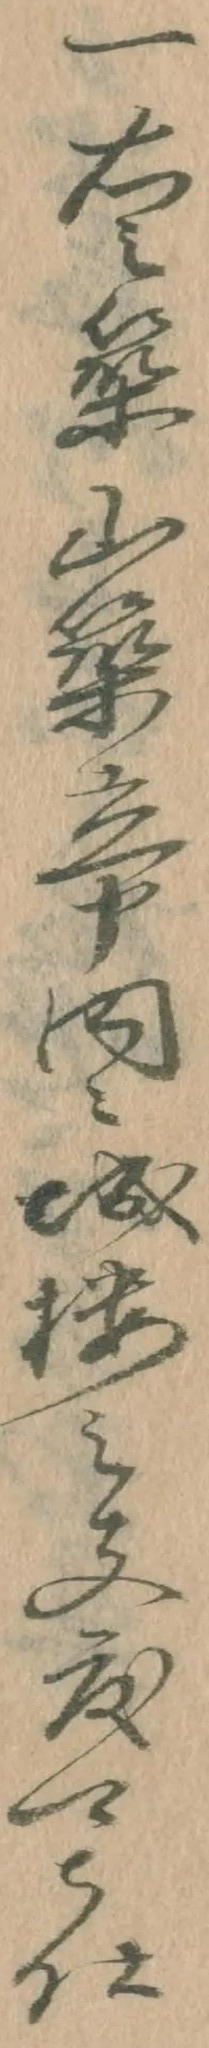一右之築山築立申内に城按之支度可被仕
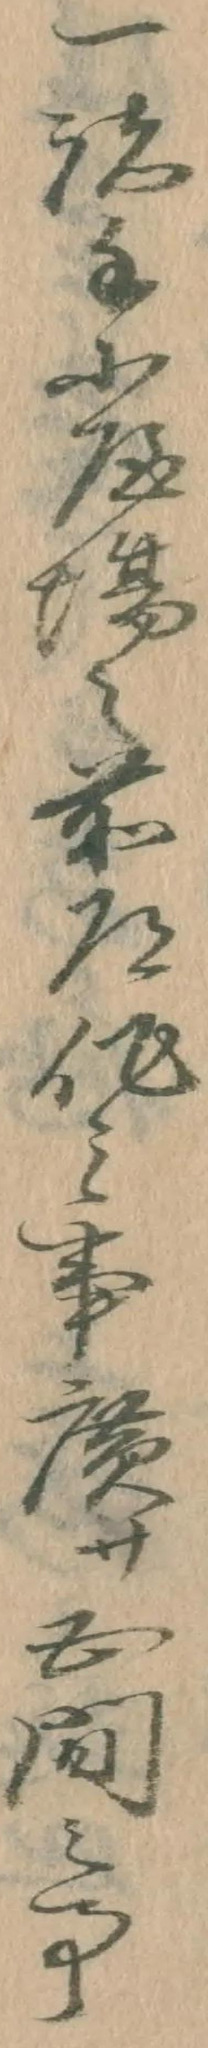一諸手小屋場之前道作之事広さ五間之事
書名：切支丹御退治記 49巻. [5]
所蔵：国立国会図書館 National Diet Library, JAPAN
